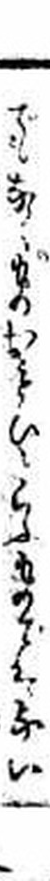でもなくものおもひといふものではない敦
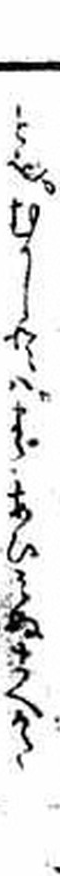と也むかしとはまだあひまだあひみぬまへかた

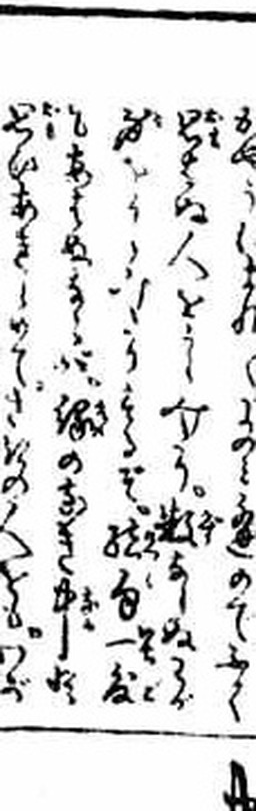身をうらみたりするぞ結句一度
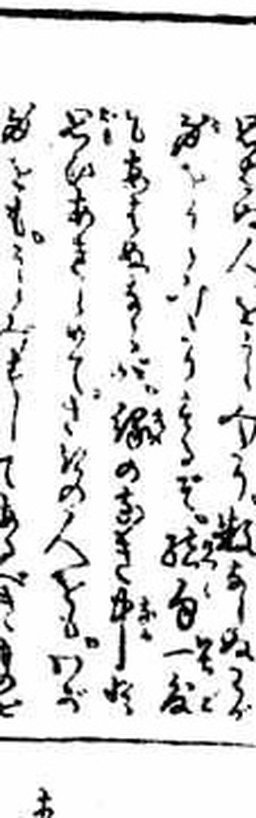もあはぬもならば縁のなき中
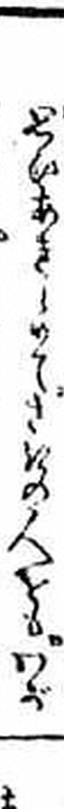思ひあきらめてさきの人をもわが
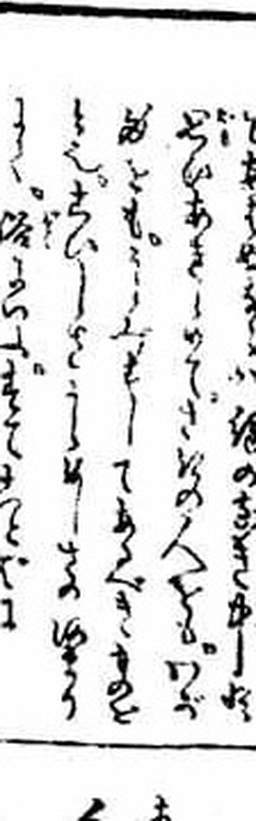身をもうらみすしてあるべきものを
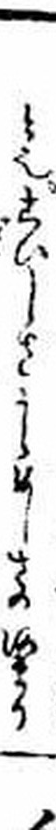と也こひしさうらめしさのあまり朝
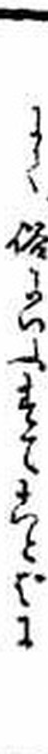にて俗にいふすてことばに
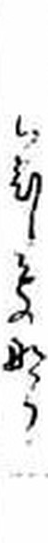いひしものなり忠
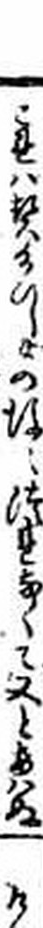これは契給ひし女の後々つれなくて又とあはぬ
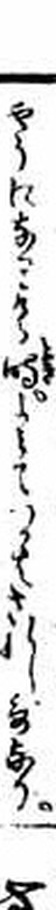やうになりける時よみてつかわされし哥なり謙徳
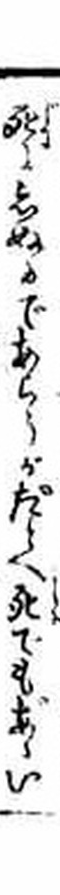死にしぬるであらうがたとへ死でもあゝい公
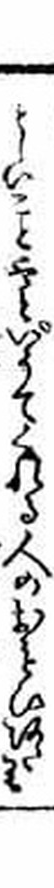としいことやいうてくれる人のおもひあたり
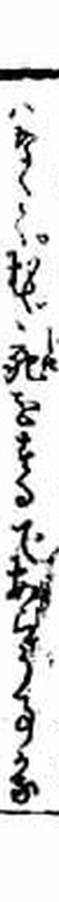はなくてむだ死にをするであらう事かな
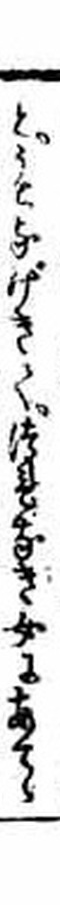とうちなげきてつれなき女にあてゝ
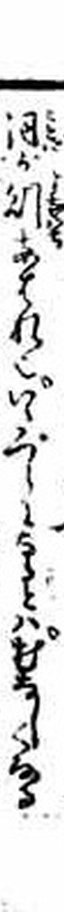詞が則あはれ也いたづらになるとはむなしくなる
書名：小倉百人一首
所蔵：東京学芸大学教育コンテンツアーカイブ
